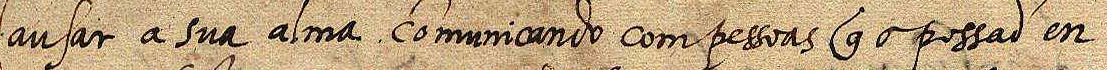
Causar a sua alma cōmunicando com pessoas q̄ o possaõ en
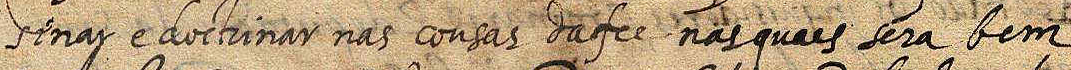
sinar e doctrinar nas cousas da fee nas quaes sera bem
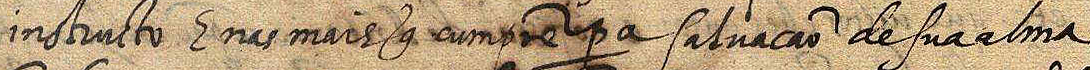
instructo E nas mais q̄ cumprē ꝑa saluacaõ de sua alma
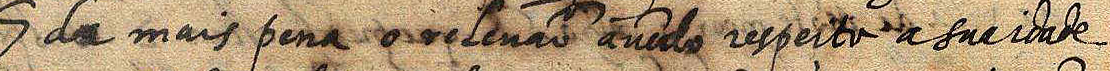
E da mais pena o releuaõ auēdo respeito a sua idade
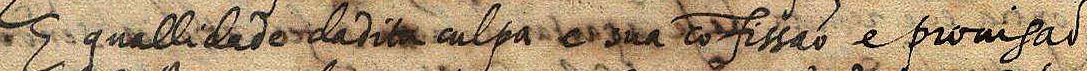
E quallidade da dita culpa e sua cōfissaõ e prouisaõ
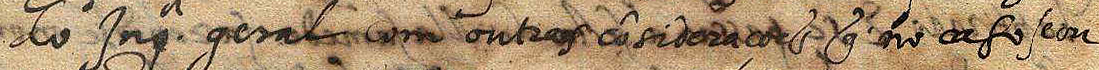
do Jnq.or geral com outras cōsideraçoẽs q̄ no caso se ou
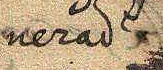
ueraõ.
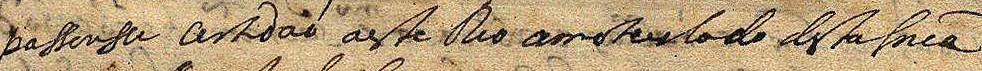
passousse certidaõ a este Reo com o treslado desta sncā
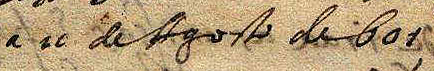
a 10 de Agosto de 601
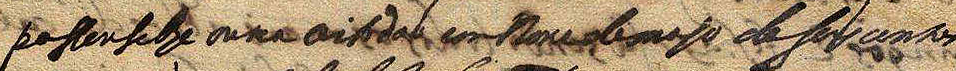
passouselhe outra certidaõ em Noue de majo de seiscentos
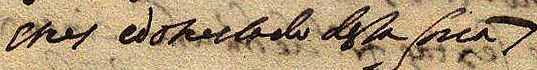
E tres cō o treslado desta sncā /
